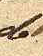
do
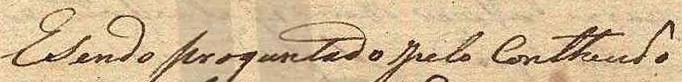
E Sendo proguntado pelo Contheudo
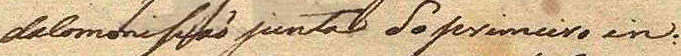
da commissaõ junta do primeiro in
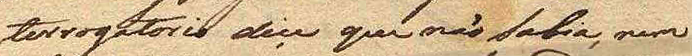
terrogatorio diçe que não Sabia, nem
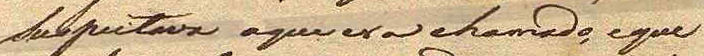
Suspeitava a que era chamado, e que
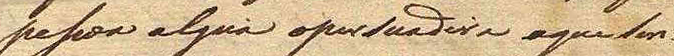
pessoa algua o persuadira a que Sen
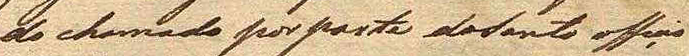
do chamado por parte do Santo offiçio
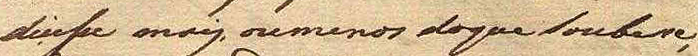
diçesse mais, ou menos do que Soubesse,
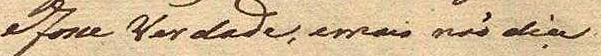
e fosse Verdade, e mais naõ diçe
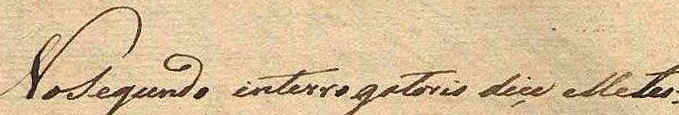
No Segundo interrogatorio diçe elle tes
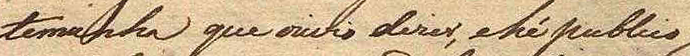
temunha que ouvio dizer, e hé publico
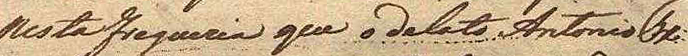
nesta freguezia que o delato Antonio Fr.
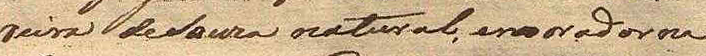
reira de souza natural, e morador na
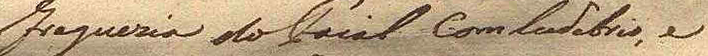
freguezia do Faial Com ludebrio, e
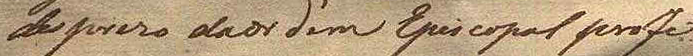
desprezo da ordem Episcopal profe
